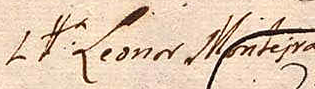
1 tt.a Leonor Montejra
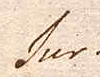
Iur.
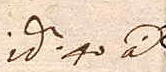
ide. 40 ā
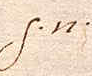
s. n.
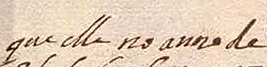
que ella no anno de
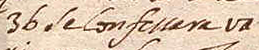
36 se Confessara va
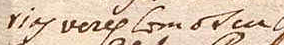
ria vezes Com o seu
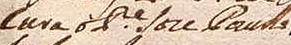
Cura o P.e Ioze Paullo
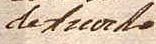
de Azevedo
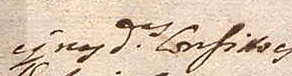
e q̄ nas d.as Confissoẽs
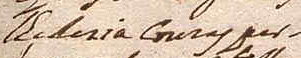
lhe dezia couzas per
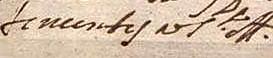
tencentes ao S.to off.o
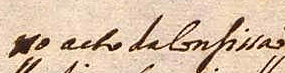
no acto da Confissaõ
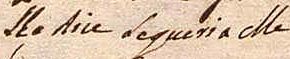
lhe dice se queria ella
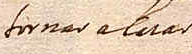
tornar a cazar
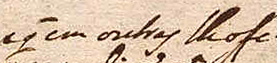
e q̄ em outras lhe offe
